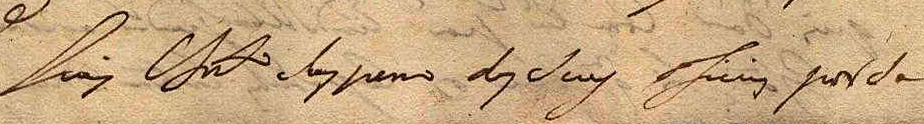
Luis Anto Suspenso dos Seus oficios por sa
